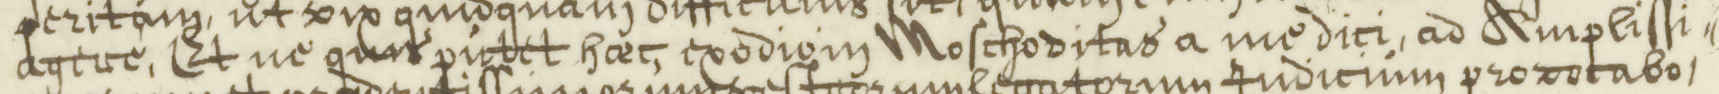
agere. Et ne quis putet hæc ex odio in Moschovitas a me dici, ad Amplissi,,
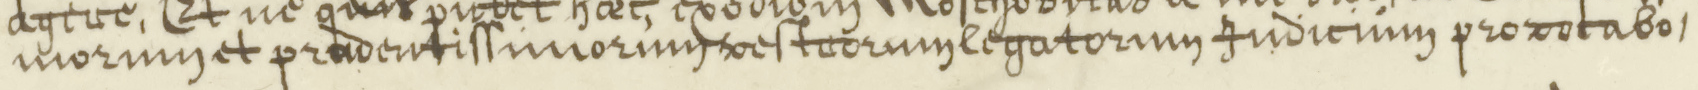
morum et prudentissimorum vestrorum legatorum Judicium provocabo.
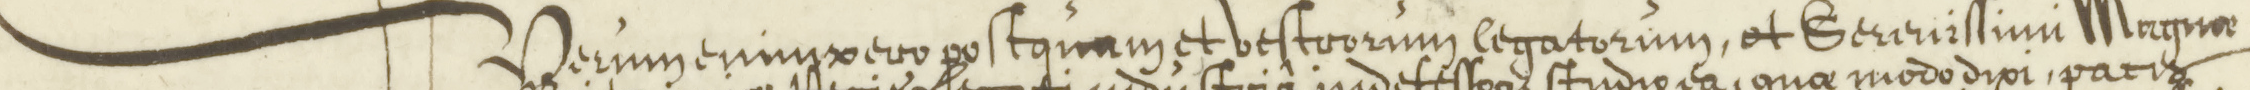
Verum enim vero postquam et vestrorum legatorum, et Serenissimi Magnæ
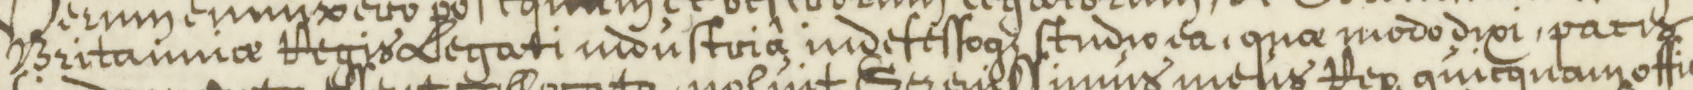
Britanniæ Regis Legati industria indefessoque studio ea, quæ modo dixi, pacis
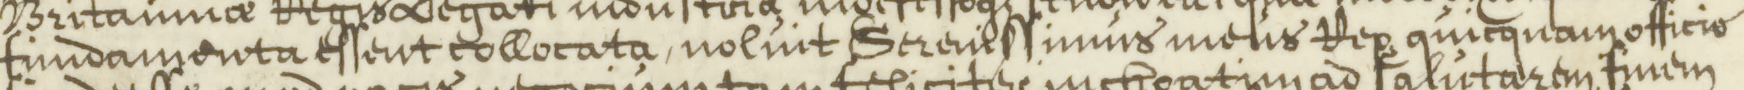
fundamenta essent collocata, noluit Serenissimus meus Rex, quicquam officio
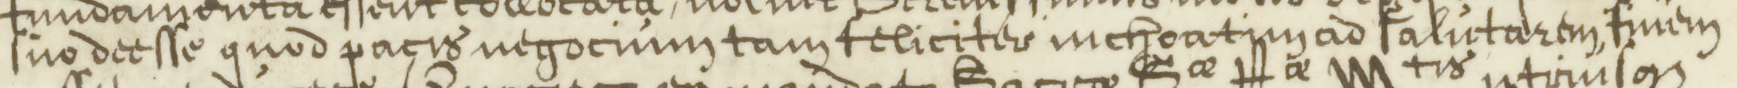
suo deesse quod pacis negocium tam feliciter inchoatum ad salutarem finem
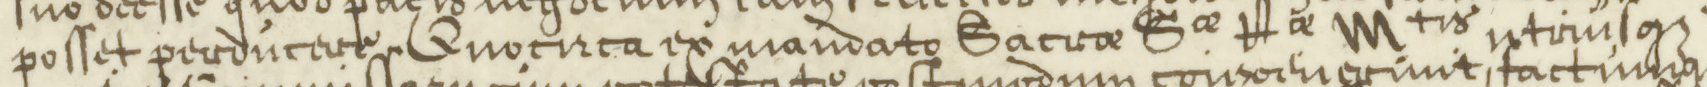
posset perducere. Quo circa ex mandato Sacræ Sæ. Ræ. Mtis utriusque
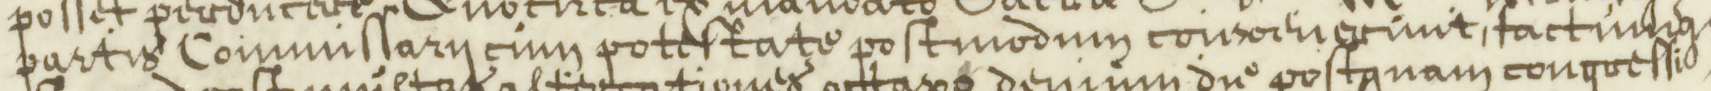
partis Commissarii cum potestate postmodum convenerunt, factumque
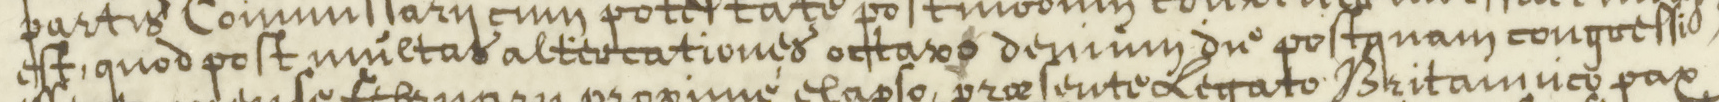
est, quod post multas altercationes octavo demum die postquam congressi
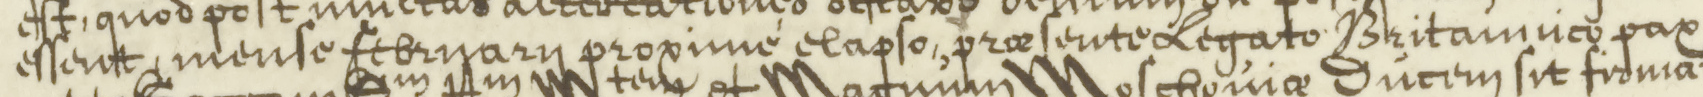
essent, mense februarii proxime elapso, præsente Legato Britannico pax
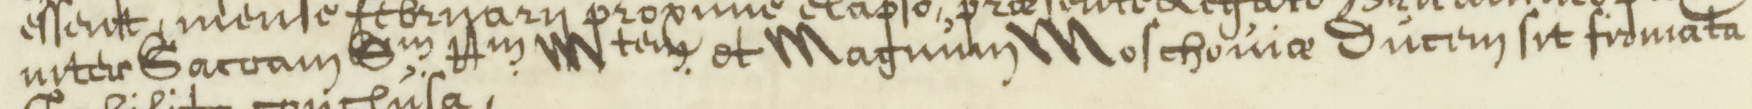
inter Sacram Sm. Rm. Mtem. et Magnum Moschouiæ Ducem sit firmata
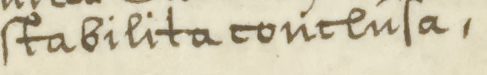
stabilita conclusa.
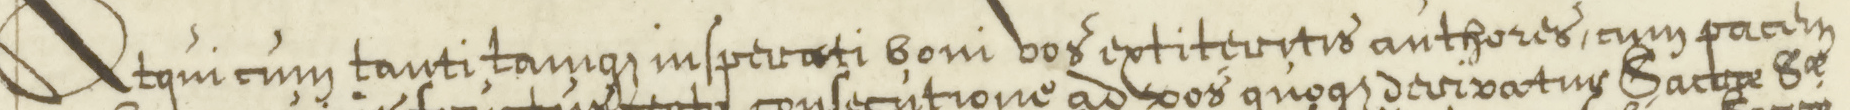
Atqui cum tanti tamque insperati boni vos extiteritis authores, cum pacem
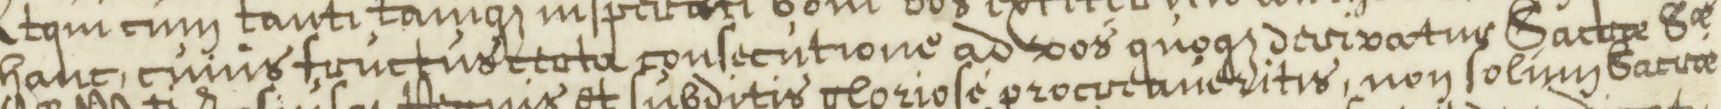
hanc, cuius fructus certa consecutione ad vos quoque derivatur Sacræ Sæ
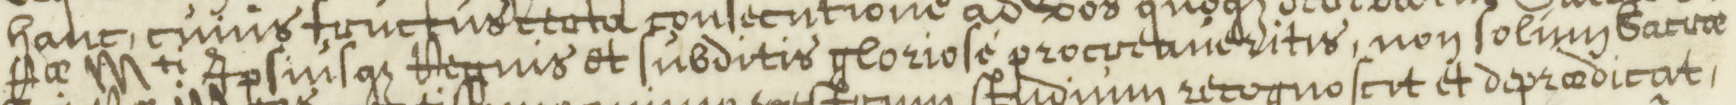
Ræ Mti. Ipsiusque Regnis et subditis gloriose procreaueritis, non solum Sacræ
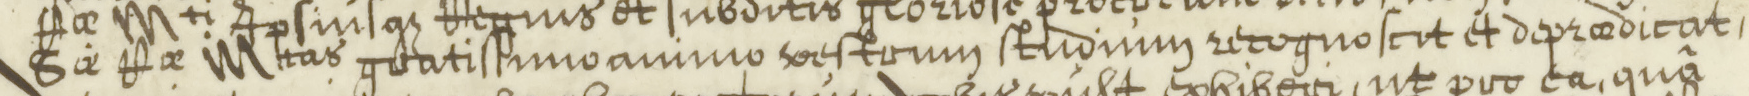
Sæ Ræ Mtas gratissimo animo vestrum studium recognoscit et deprædicat,
